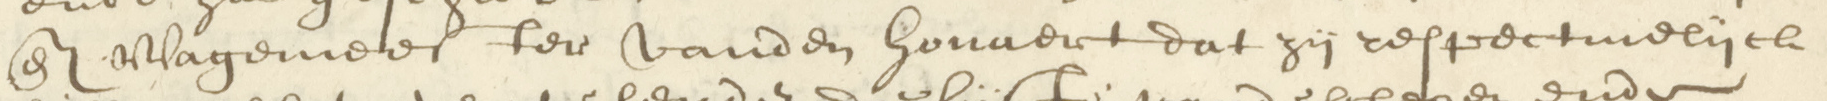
& Wagemeester vanden Honaert dat zij respectiuelijck
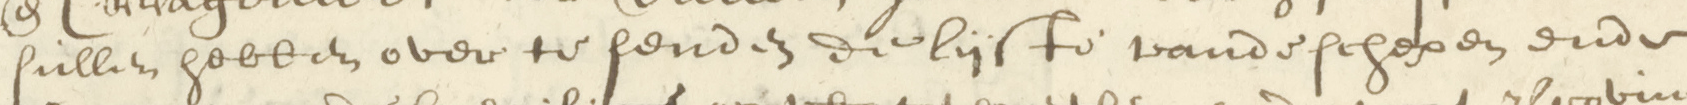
sullen hebben over te senden de lijste vande schepen ende
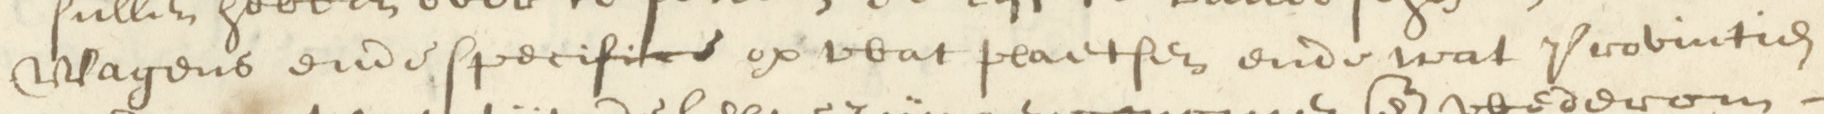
wagens ende specifice op wat plaetsen ende wat provintien
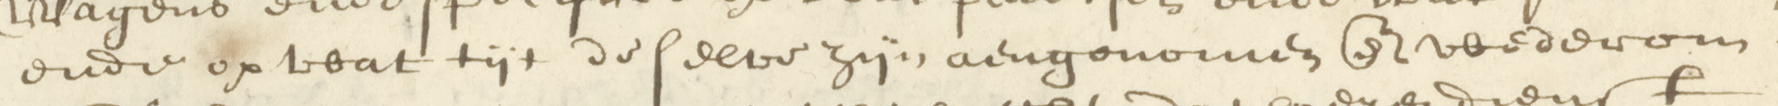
ende op wat tijt de selve zijn aengenomen & wederom
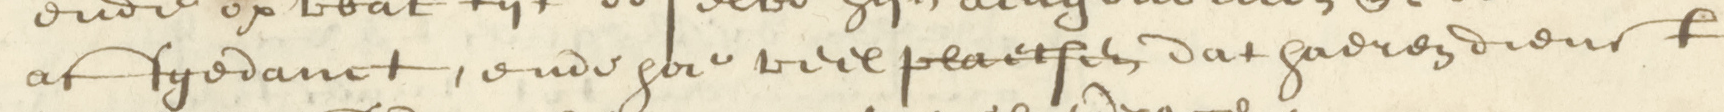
affgedanct, ende hoe veel plaetsen dat haeren dienst
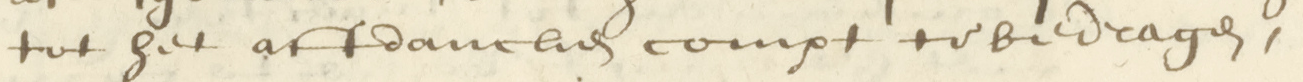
tot het affdancken compt te bedragen.
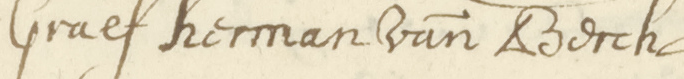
Graef Herman van Berch
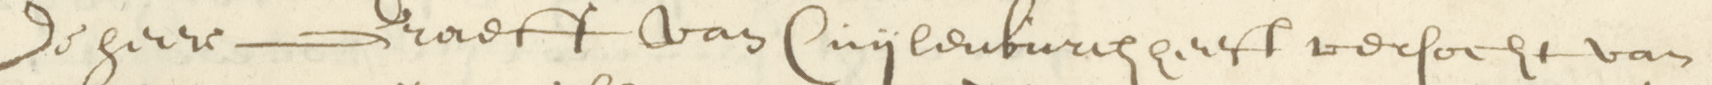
De heere Graeff van Cuijlenburch heeft versocht van
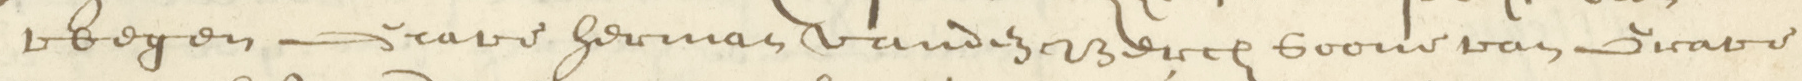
wegen Grave Herman vanden Berch soone van Grave
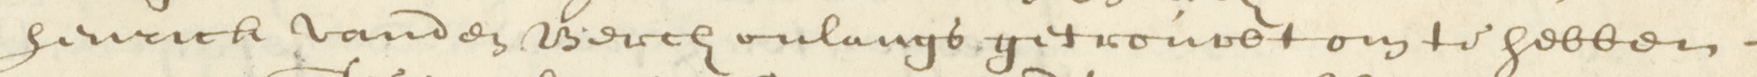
Henrick vanden Berch onlangs getrouwt om te hebben
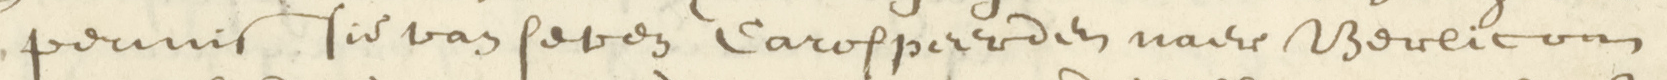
permissie van seven Carospeerden naer Berlicom
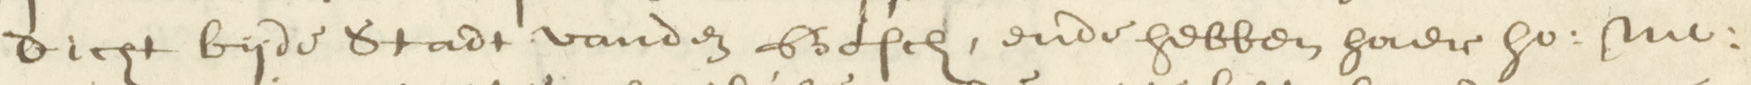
dicht bijde Stadt vanden Bosch, ende hebben haer ho:mo:
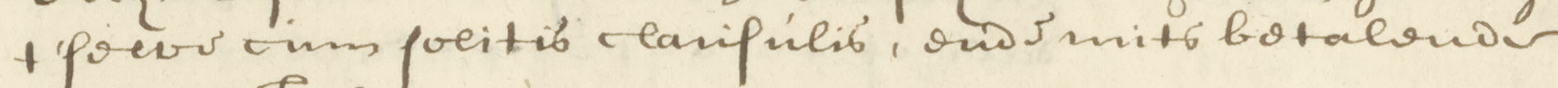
t'selve cum solitis clausulis, ende mits betalende
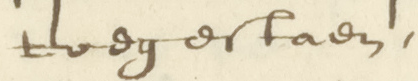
toegestaen.
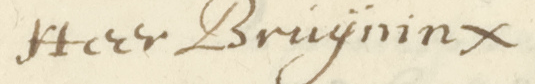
Heer Bruijninx
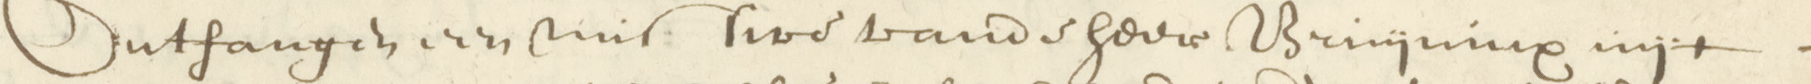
Ontfangen een missive vande heer Bruijninx uijt
